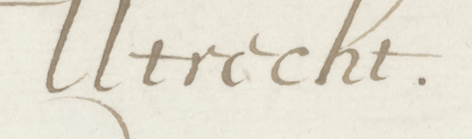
Utrecht.
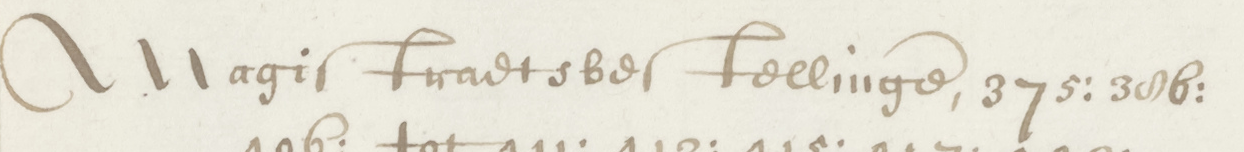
Magistraetsbestellinge, 375: 386:
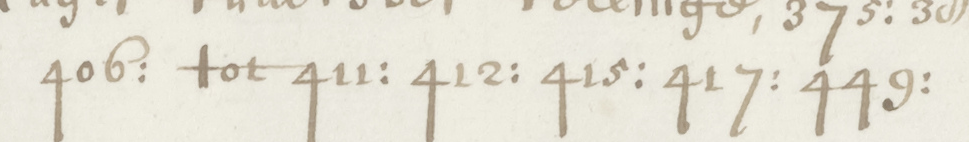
406: tot 411: 412: 415: 417: 449:
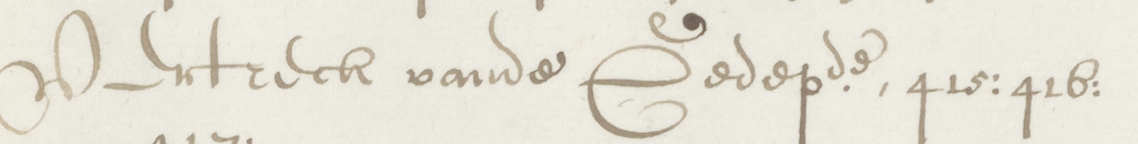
Vertreck vande Gedepde., 415: 416:
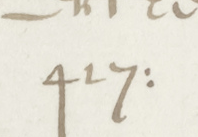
417:
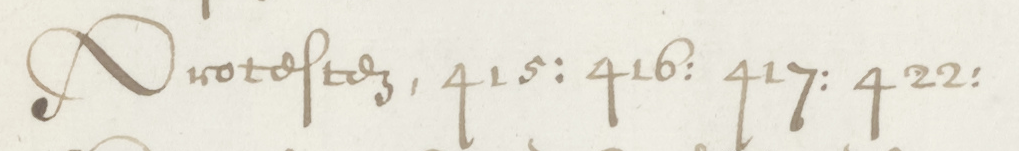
Protesten, 415: 416: 417: 422:
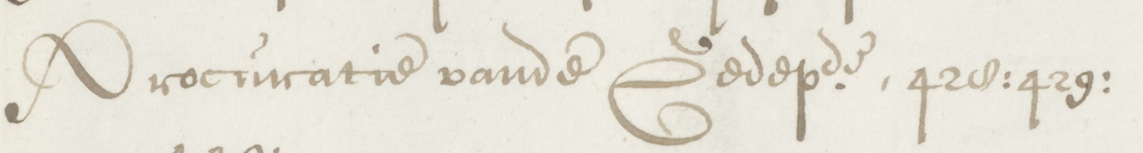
Procuratie vande Gedepde., 428: 429:
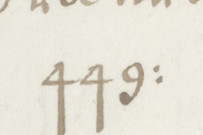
449:
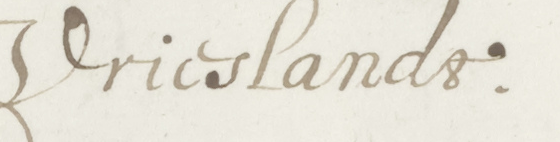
Vrieslandt:
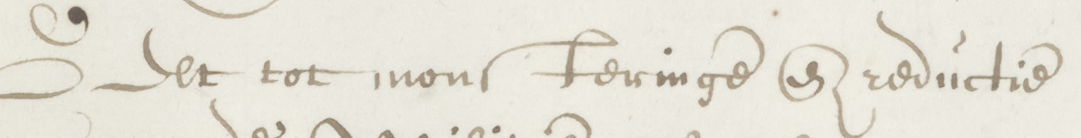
Gelt tot monsteringe en reductie
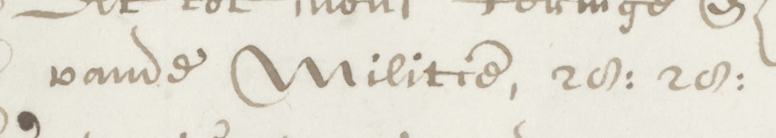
vande Militie, 28: 28:
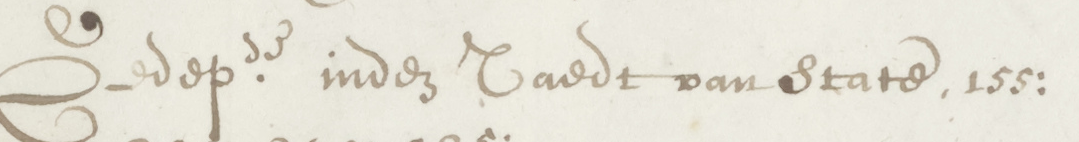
Gedepde. inden Raedt van State, 155:
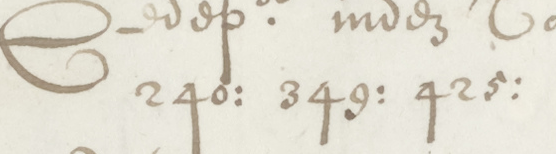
240: 349: 425:
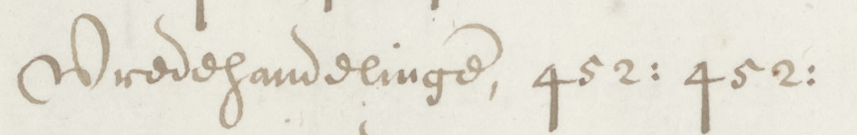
Vredehandelinge, 452: 452:
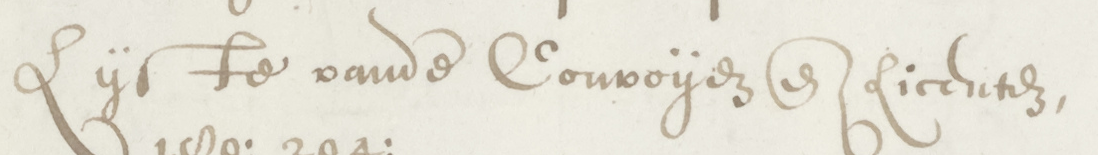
Lijste vande Convoijen en Licenten,
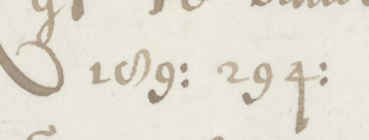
189: 294:
